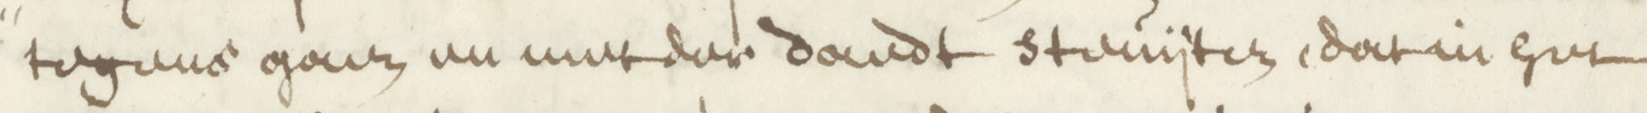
tegens gaen en metder daedt steuijten, dat in het
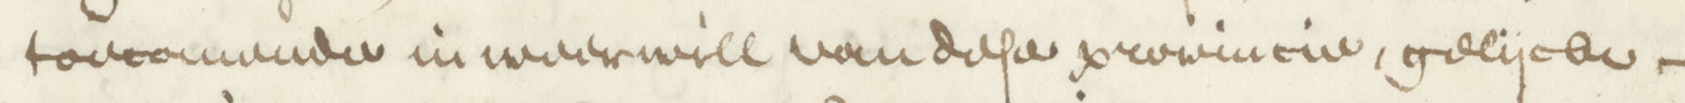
toecomende in weerwill van dese provincie, gelijck
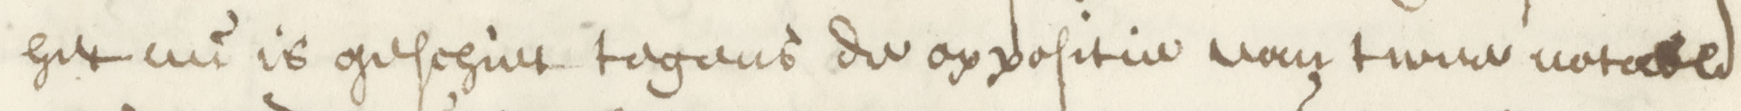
het nu is geschiet tegens de oppositie van twee notable
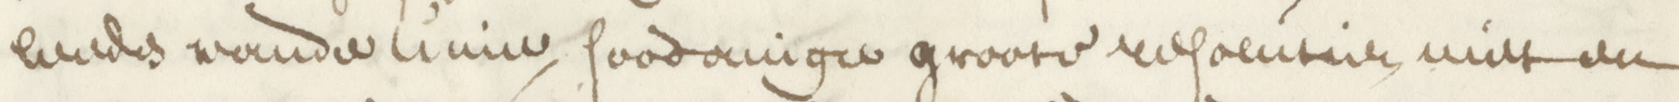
leeden vande Unie, soodanige groote resolutien niet en
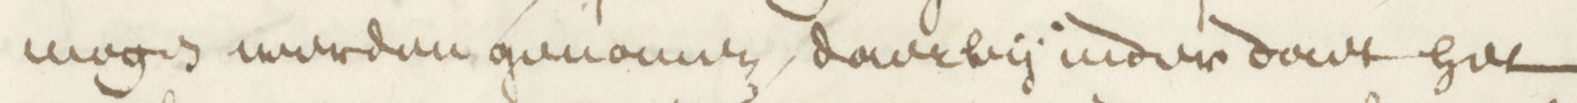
mogen werden genomen, daerbij inder daet het
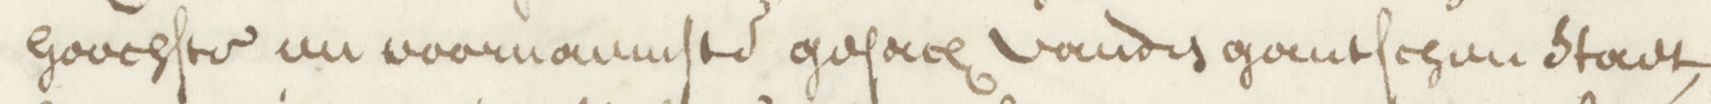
hoochste en voornaemste gesach vanden gantschen staet
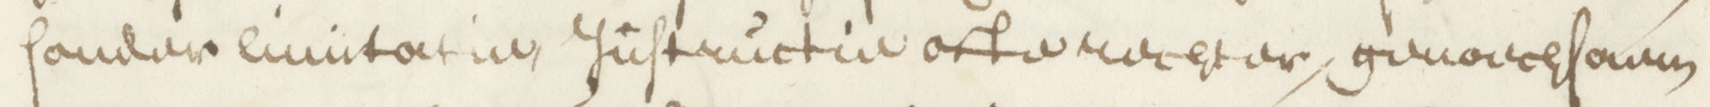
sonder limitatie, Instructie ofte rechter, genoechsaem
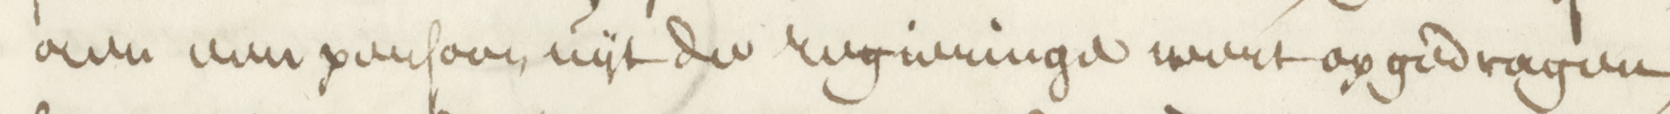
aen een persoon uijt de regieringe wert opgedragen
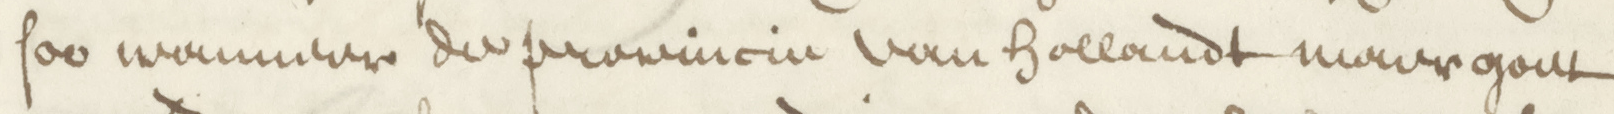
soo wanneer de provincie van Hollandt maer goet
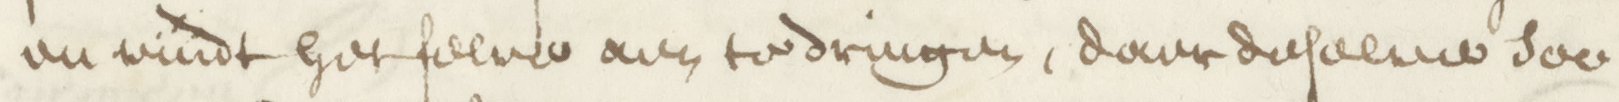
en vindt het selve aen te dringen, daer deselve soe
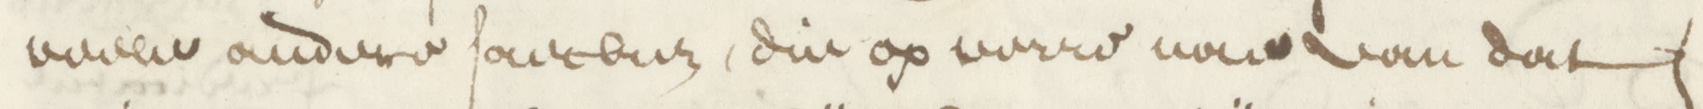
veele andere saecken, die op verre nae van dat
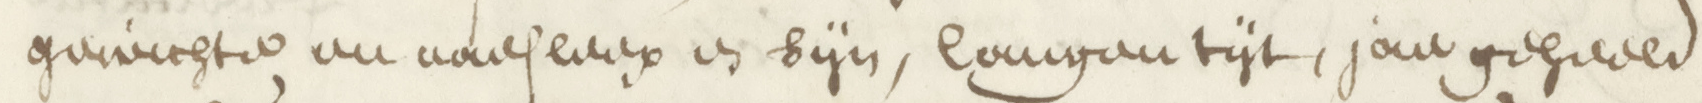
gewichte en nasleep en sijn, langen tijt, jae geheele
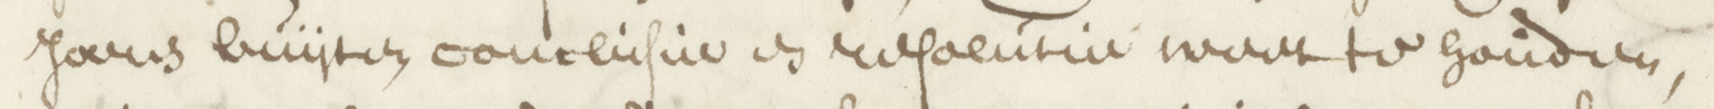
Jaren buijten conclusie en resolutie weet te houden,
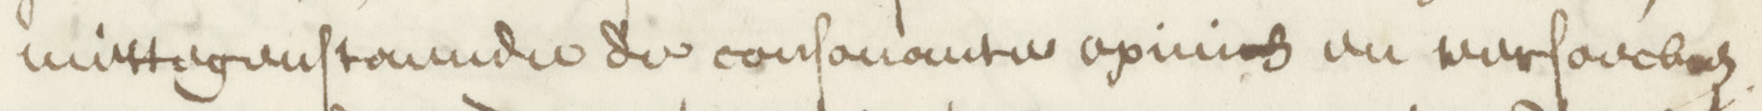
niettegenstaende de consonante opinien en versoecken
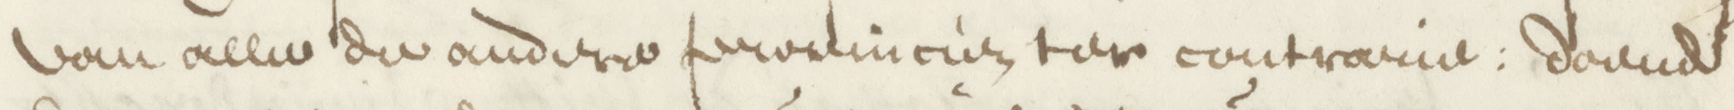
van alle de andere provincien ter contrarie: doende
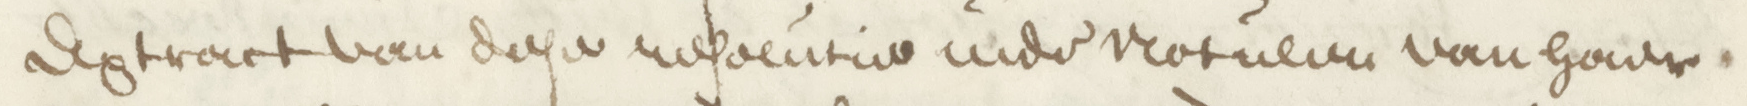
Extract van dese resolutie inde Notulen van haer
